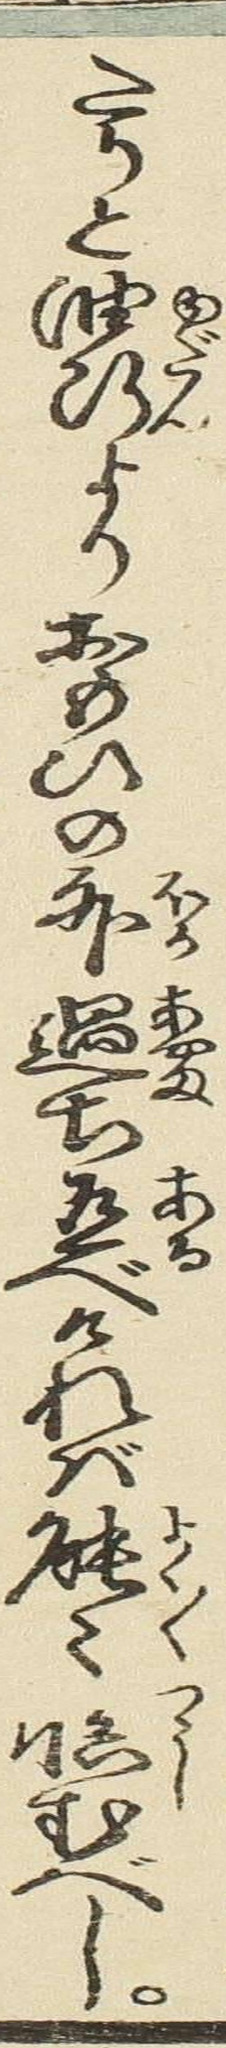たりと油断よりおもひの外過ち有べければ能々慎むべし。
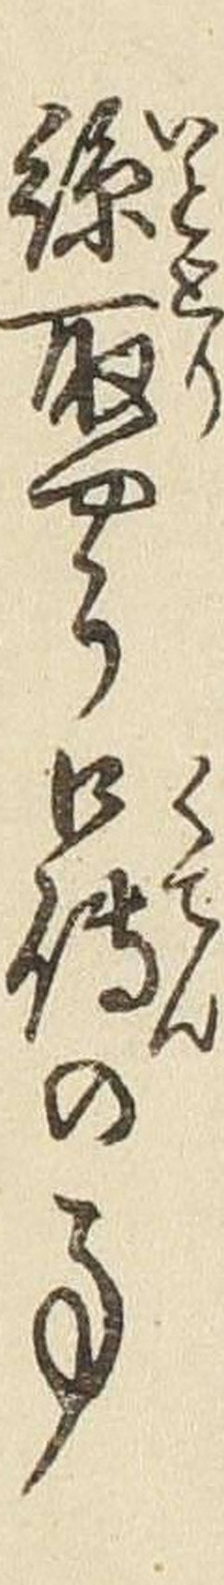糸取やう口伝の事
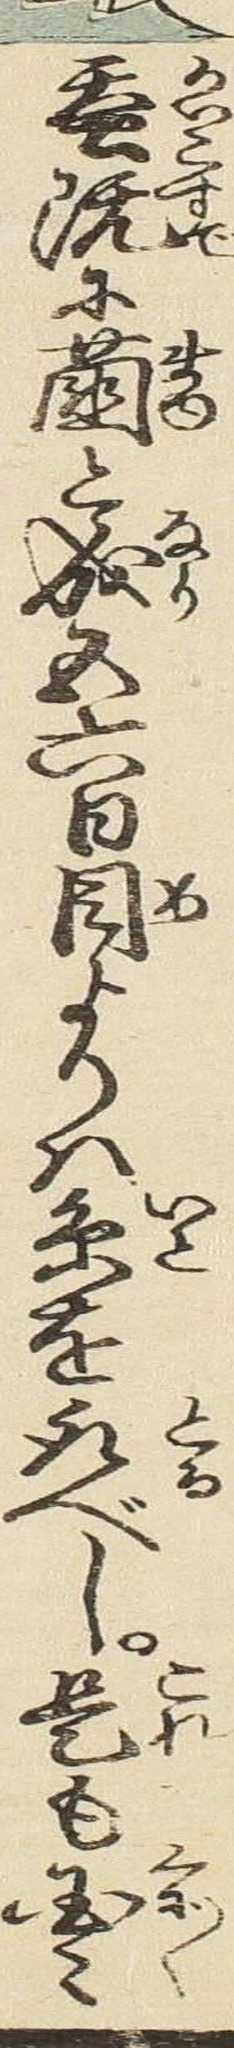蚕既に繭と成五六日目よりは糸を取べし。是も国々
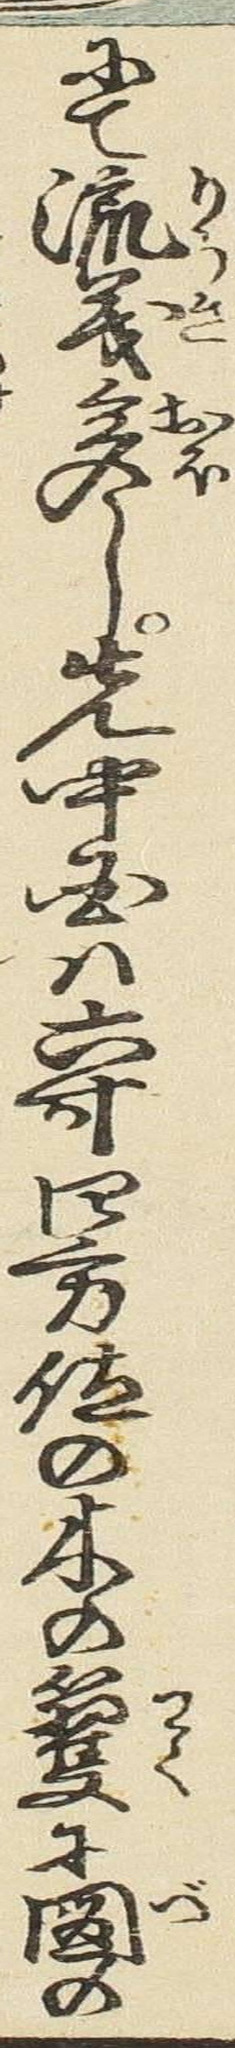にて流義多し。先中国は六寸四方位の木の籆に図の
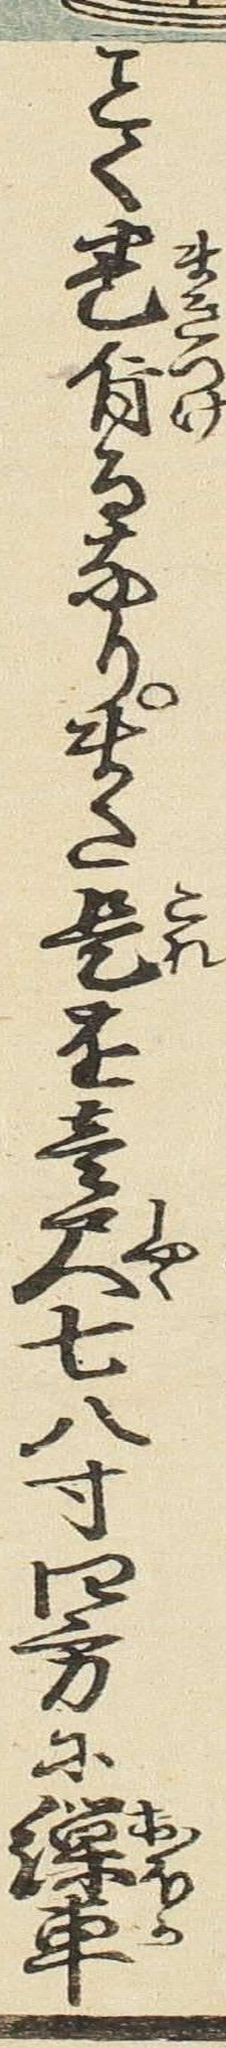ことく巻付るなり。また是を壱尺七八寸四方に繰車
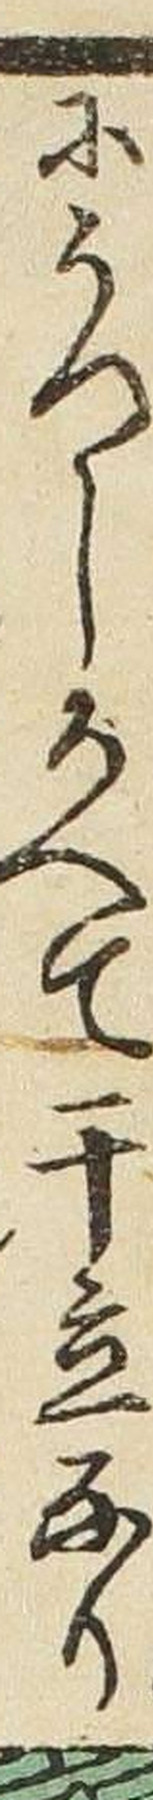にうつしかへて干立なり。
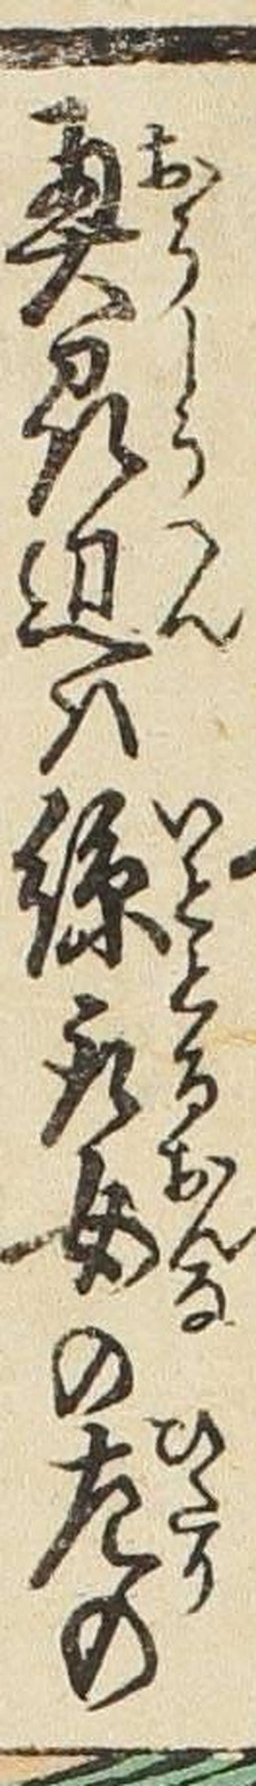奥州辺は糸取女の左の
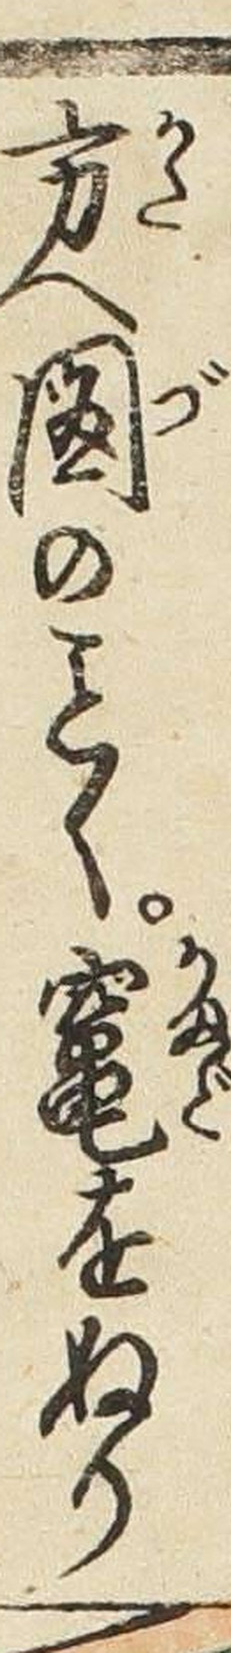方へ図のことく。竈をぬり
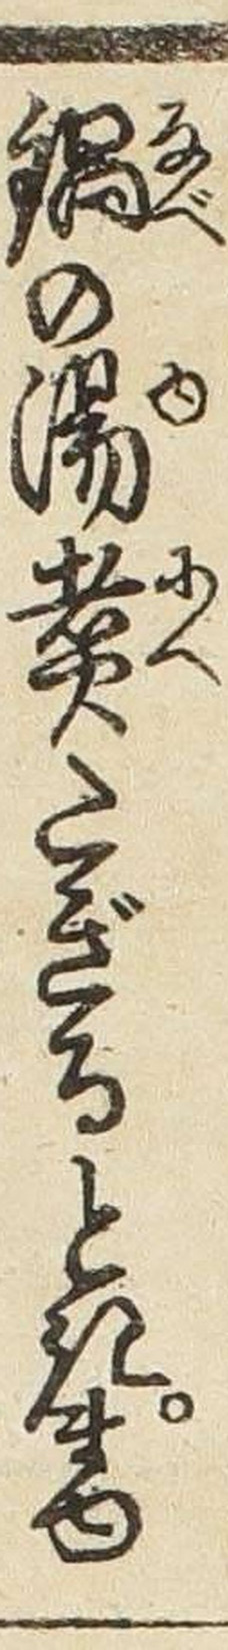鍋の湯煮たぎるとき。まゆ
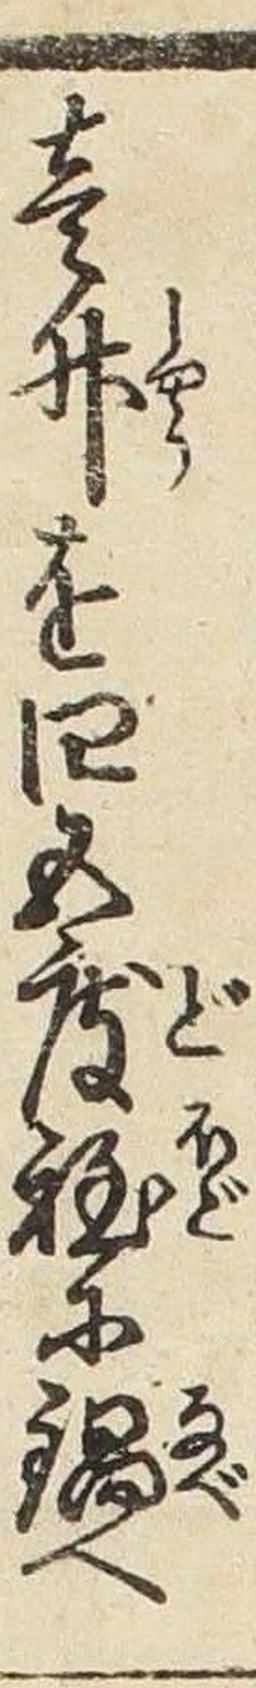壱升を四五度程に鍋へ
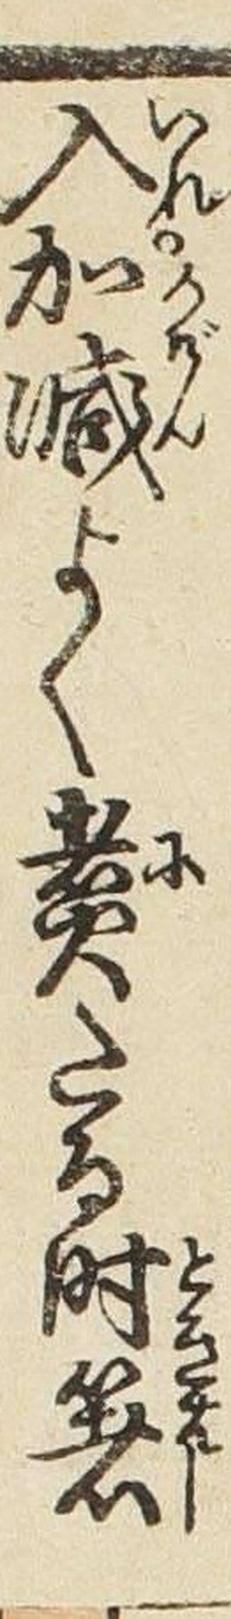入。加減よく煮たる時箸
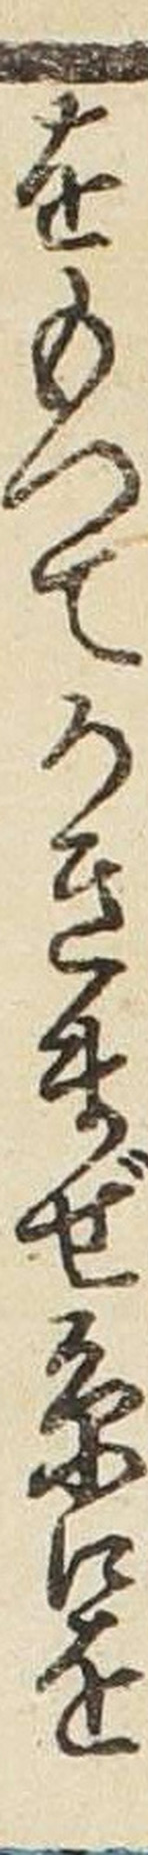をもつてかきまぜ。糸口を
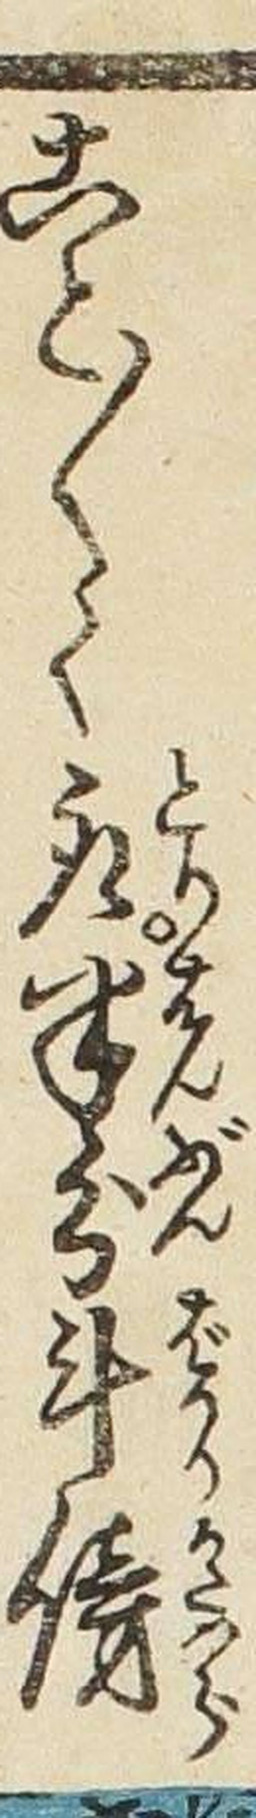こと〳〵く取。半分斗傍
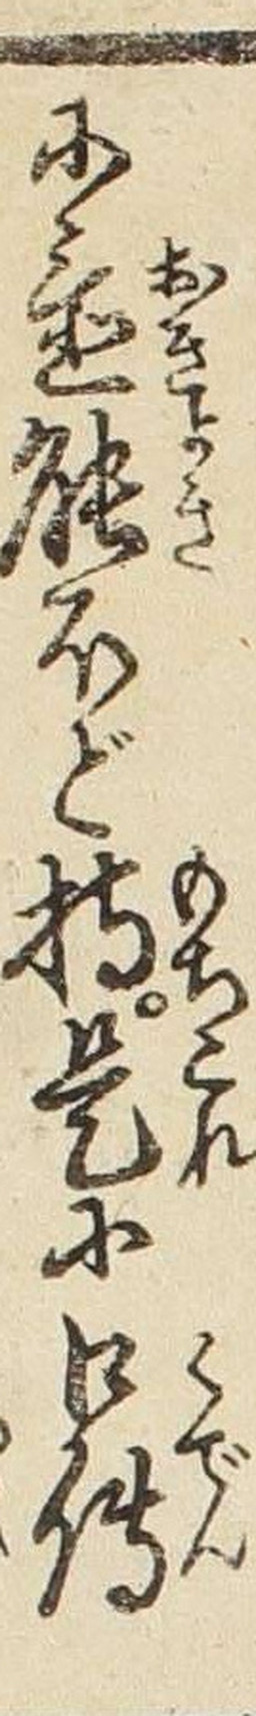に置能ほど持。是に口伝
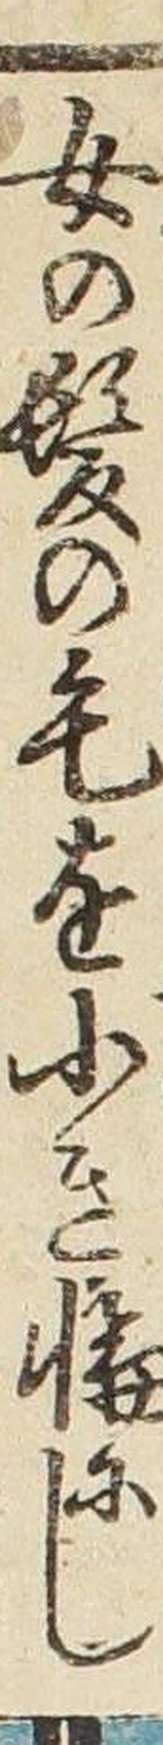女の髪の毛を小き輪にし
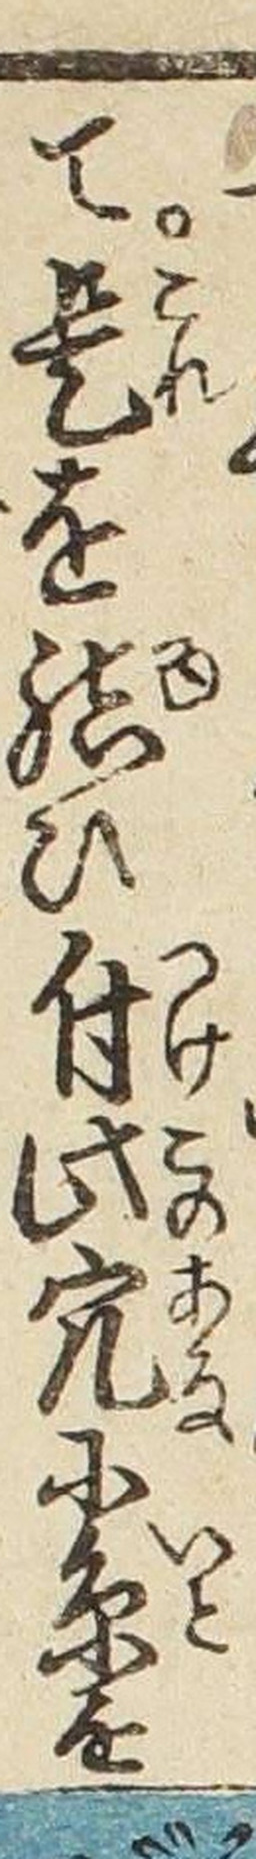て。是を結ひ付此穴に糸を
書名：養蠶圖解
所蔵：東京大学農学生命科学図書館 国文学研究資料館
